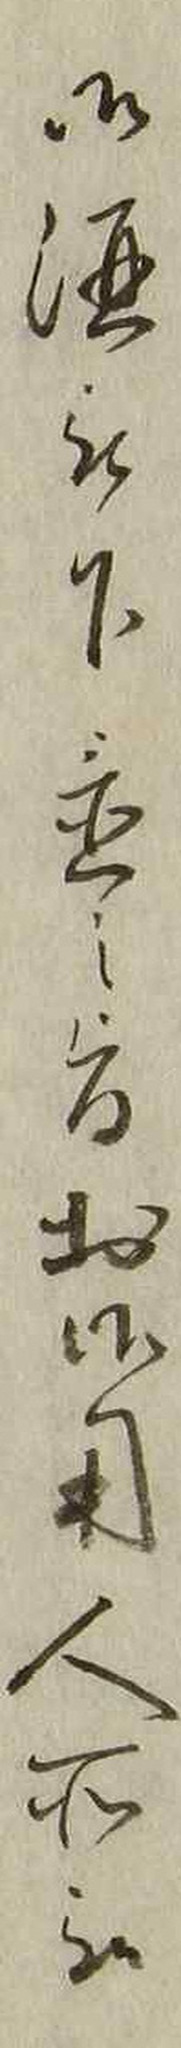御酒被下置之旨於御用人所被
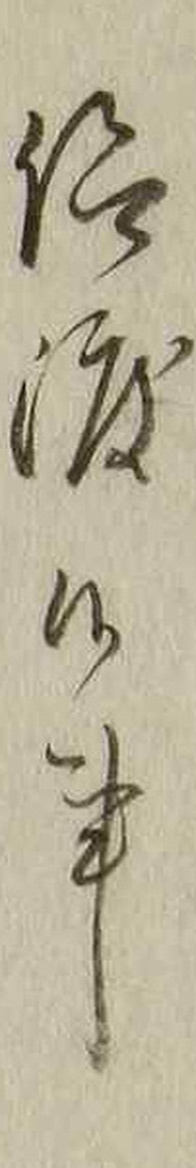仰渡候事
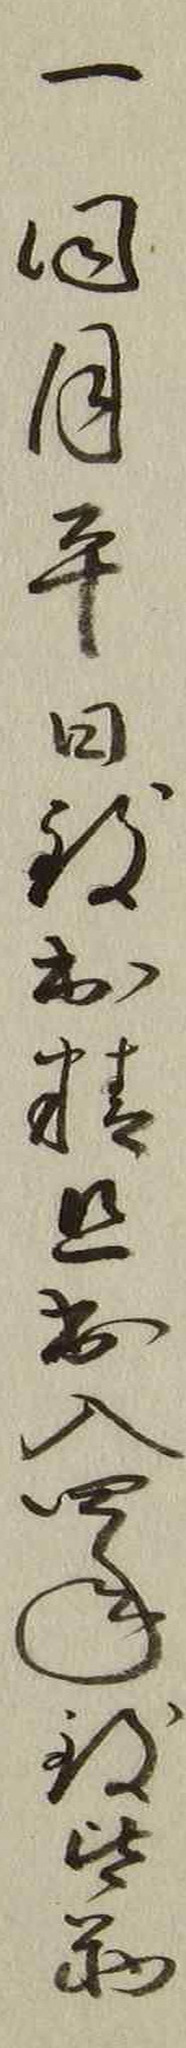一同月平日致出精且出入四年致皆勤
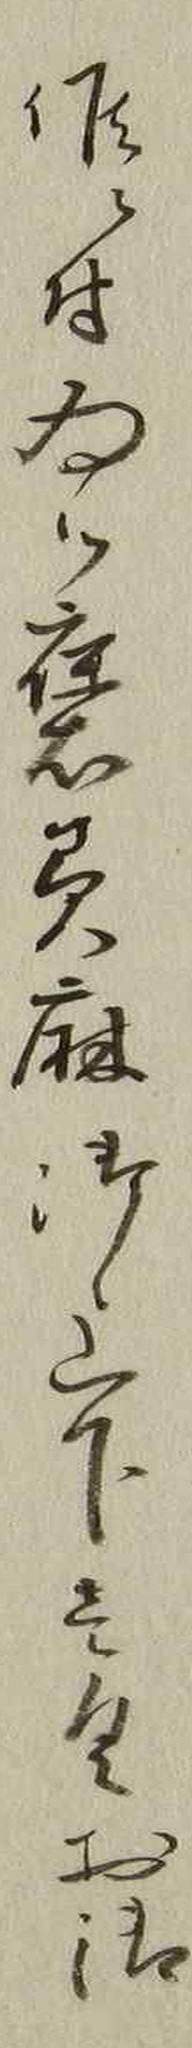候ニ付為御褒美麻御上下壱具於御
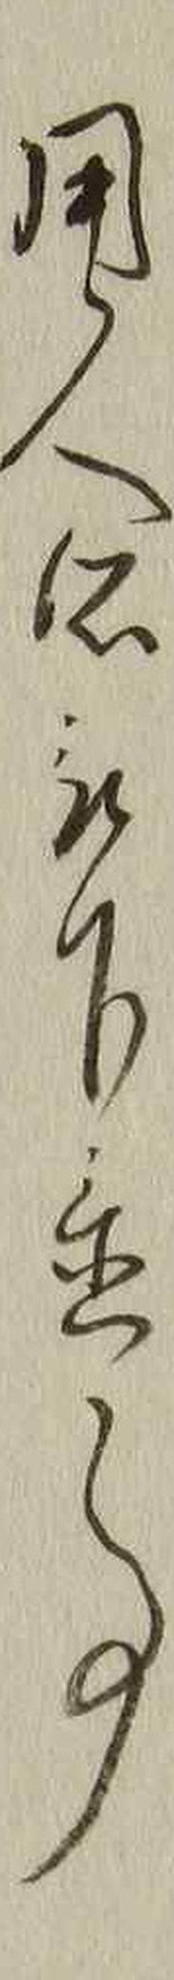用人所被下置候事
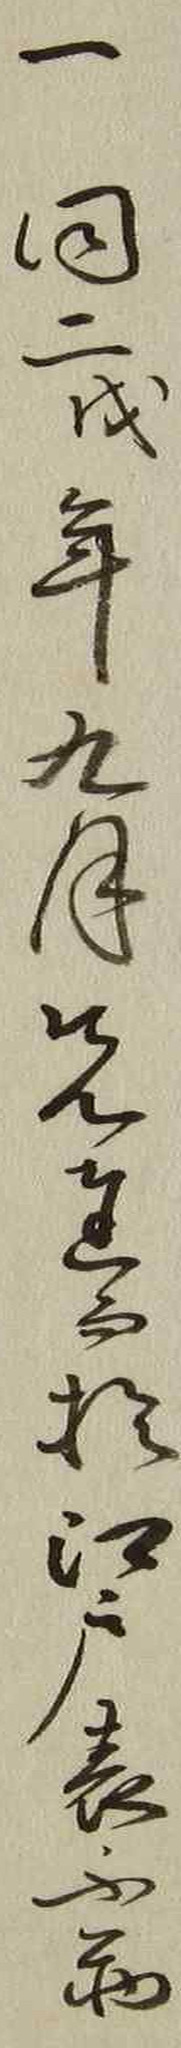一同二戌年九月先達而於江戸表不勤
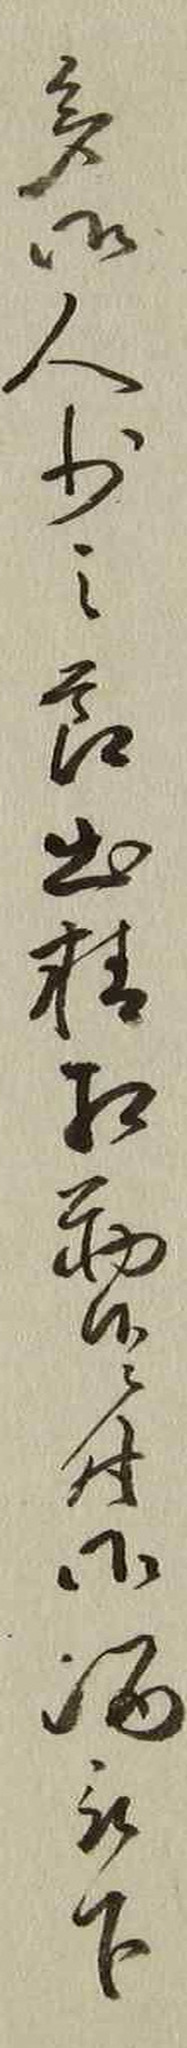多御人少之節出精相勤候ニ付御酒被下
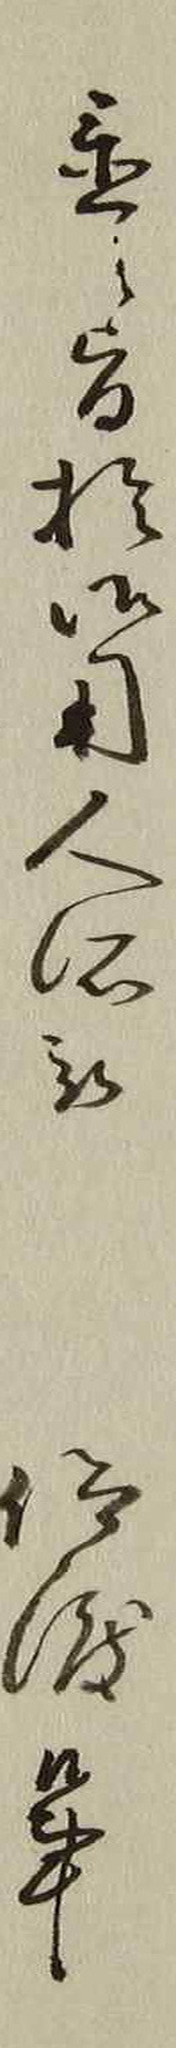置之旨於御用人所被仰渡候事
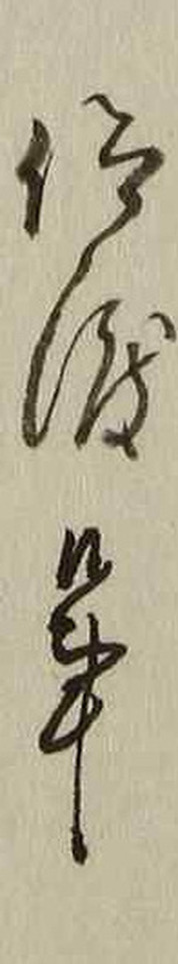仰渡候事
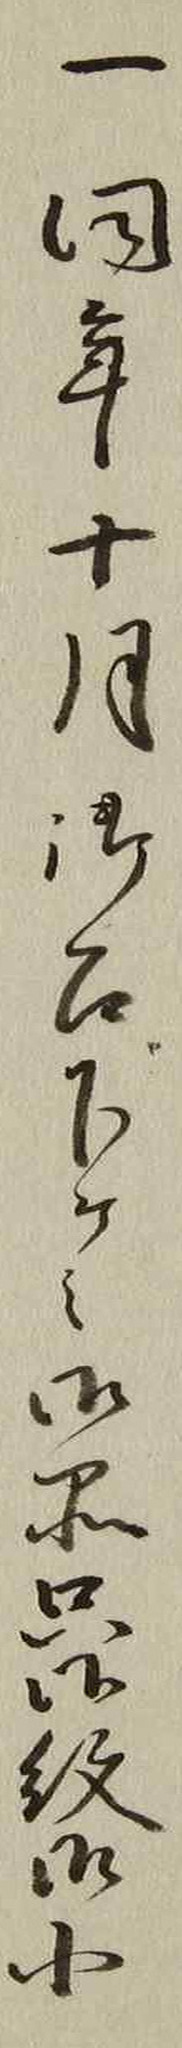一同年十月御召下ケ之御品只御紋御小
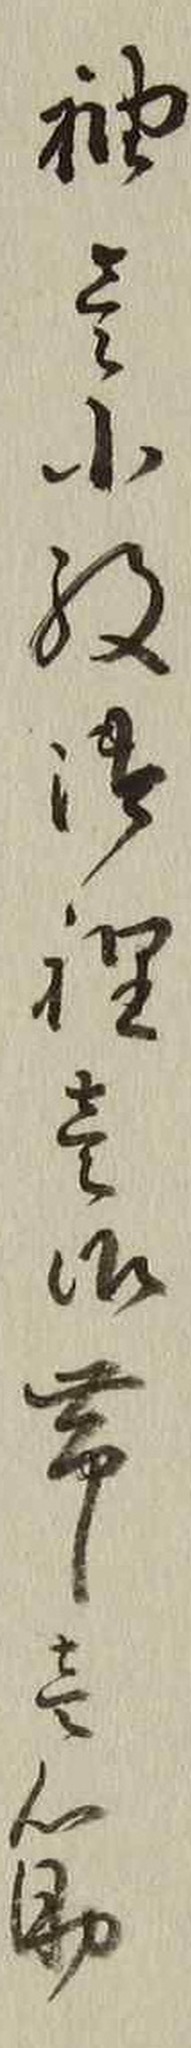袖壱小紋御裡壱御帯壱筋
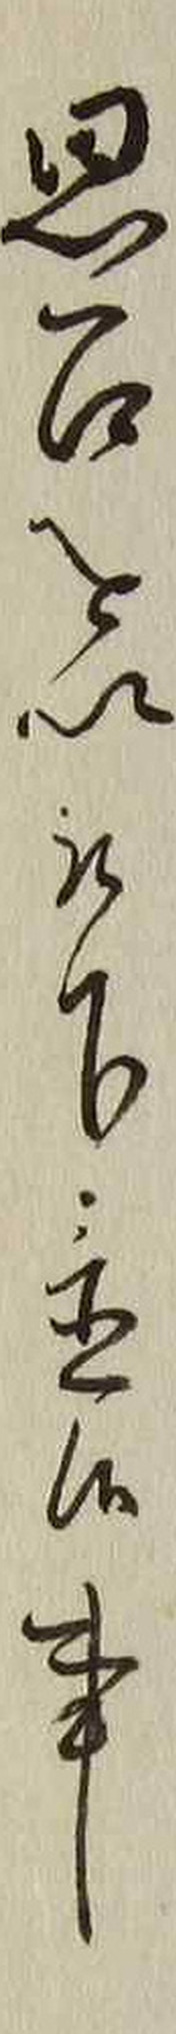思召を以被下置候事
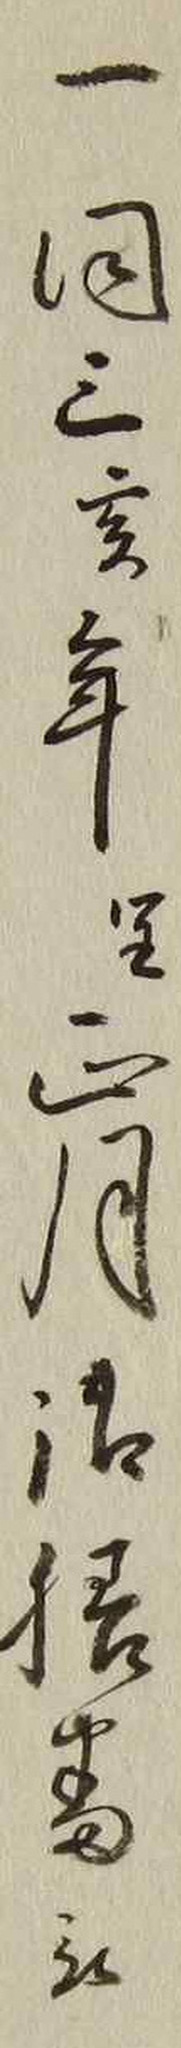一同三亥年閏正月御膳番被
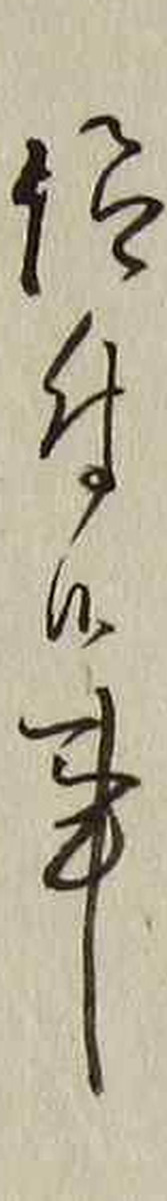仰付候事
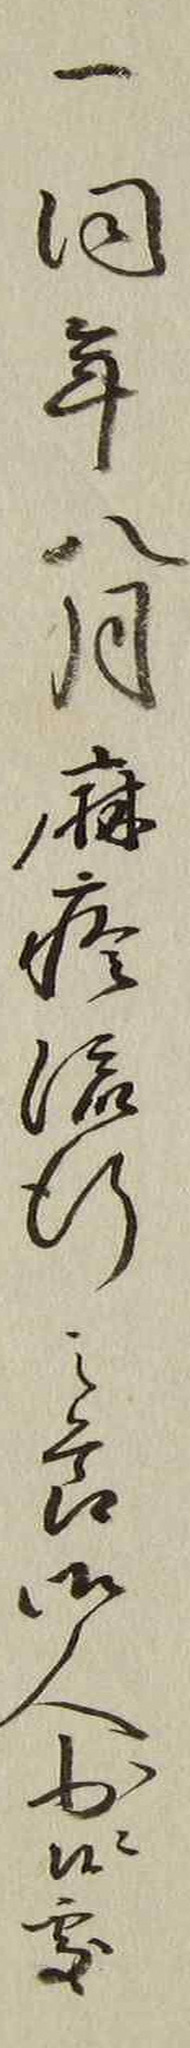一同年八月麻疹流行之節御人少ニ候処
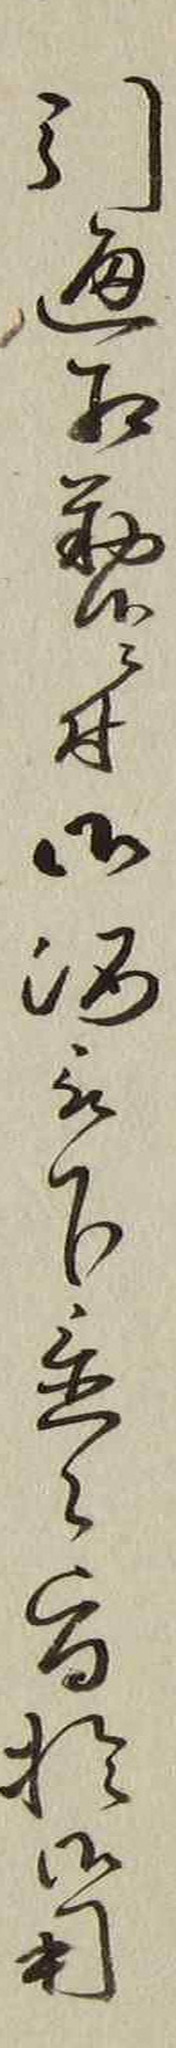引通相勤候ニ付御酒被下置之旨於御用
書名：諸士系譜　巻之4　い之部4
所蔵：会津若松市立会津図書館
